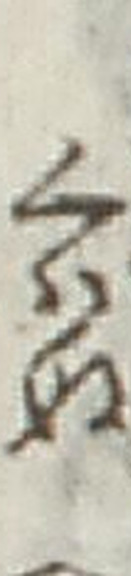くはぬ
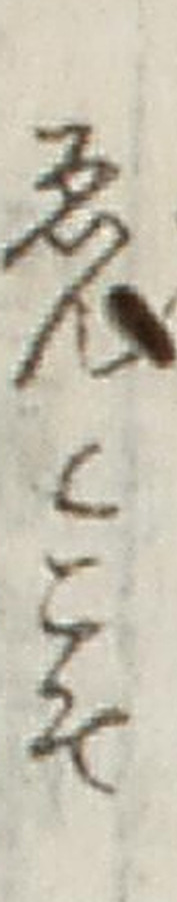ゑんとこそ
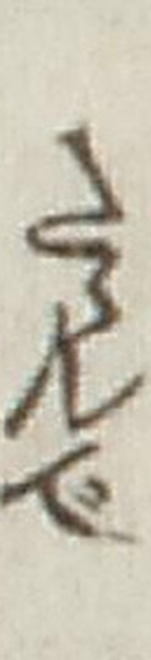たゝんで
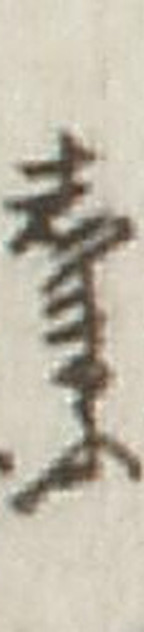しまふ

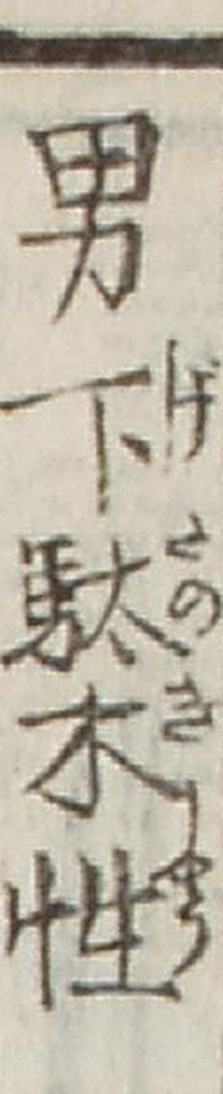男下駄木性
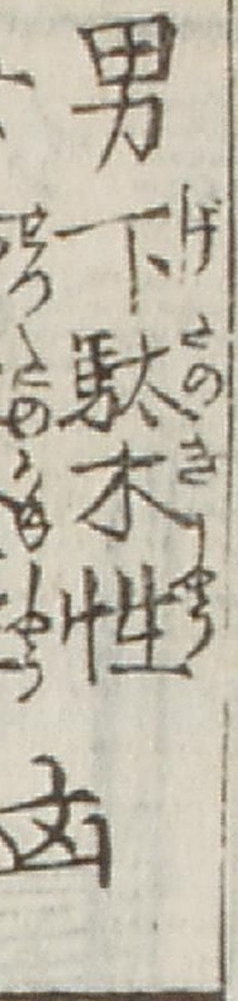男下駄木性
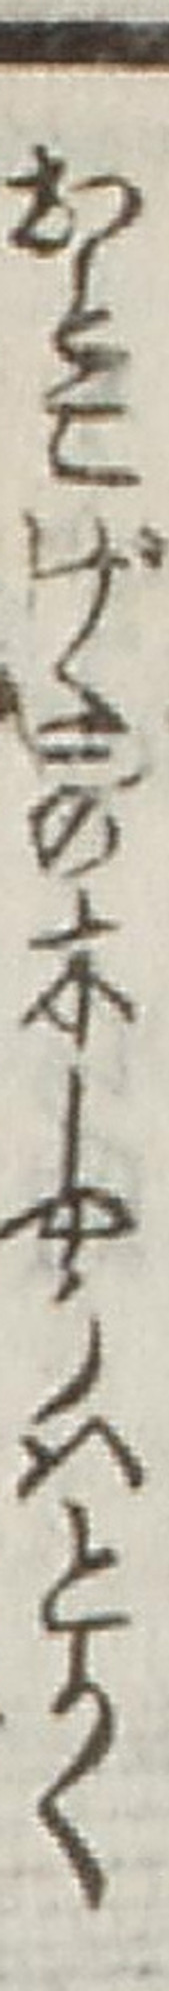おとこげたの木しやうはとかく
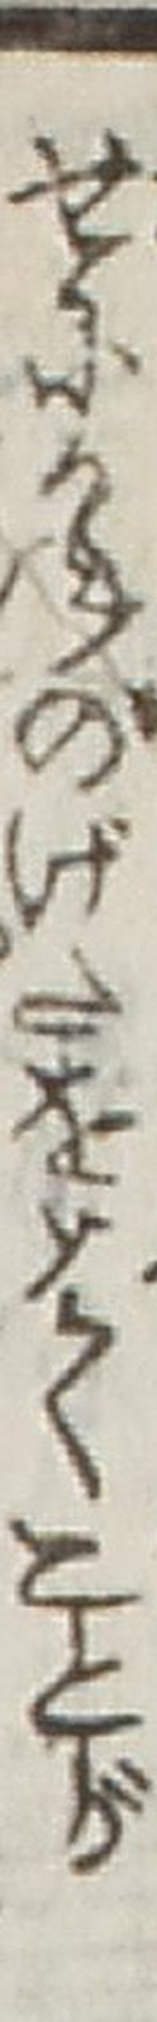せにかねのげたをはくことが
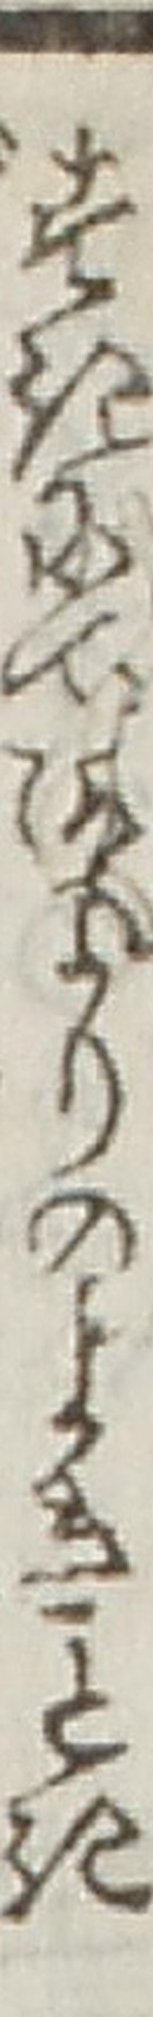すきにてひよりのよきとき
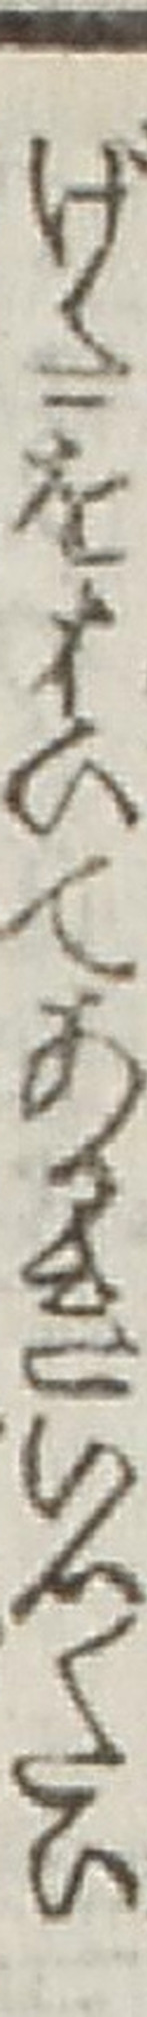げたをはいてあるきいつたい
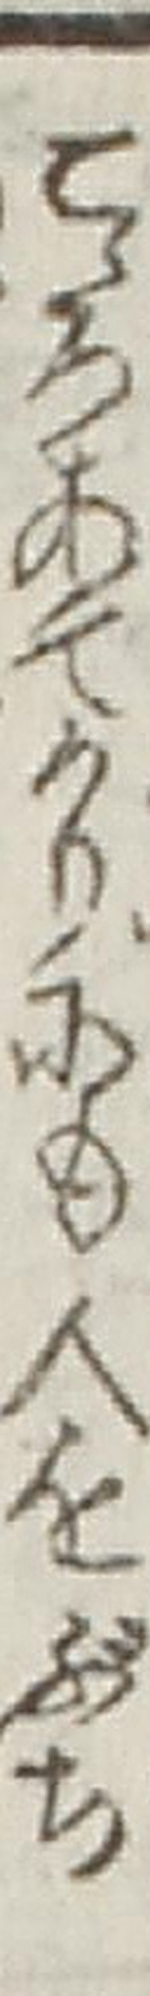こゝろあてかりにも人をぶち
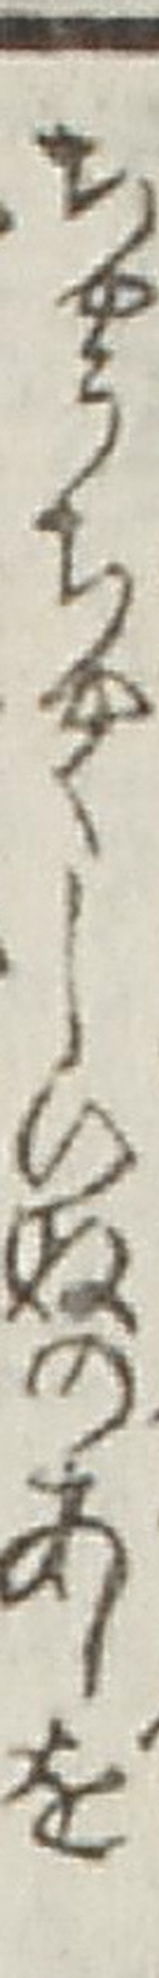ちやうちやくしいぬのあしを
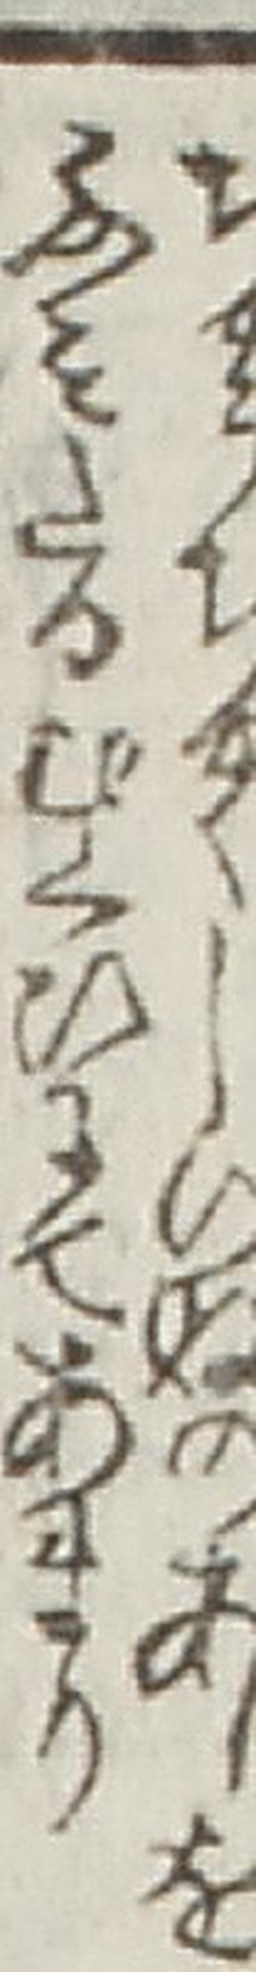ふみたるむくひにてあまり
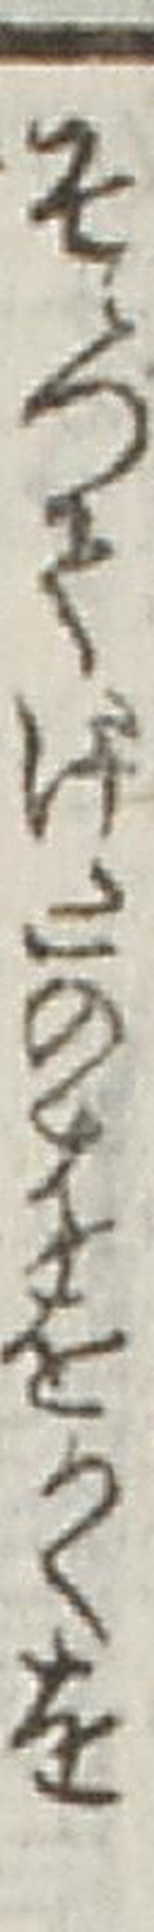そゝつてげたのはをかくを
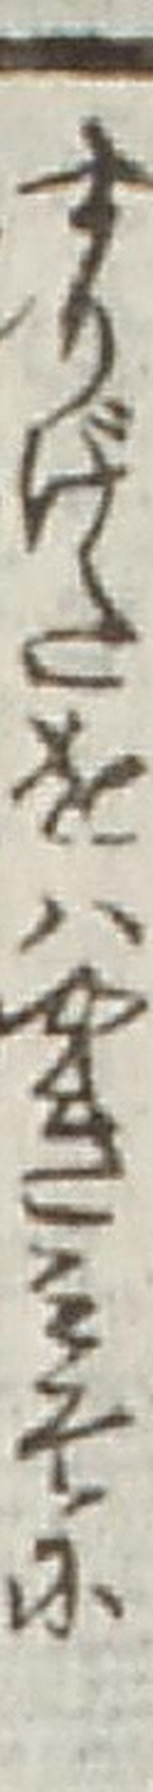すりげたをはやきみそに
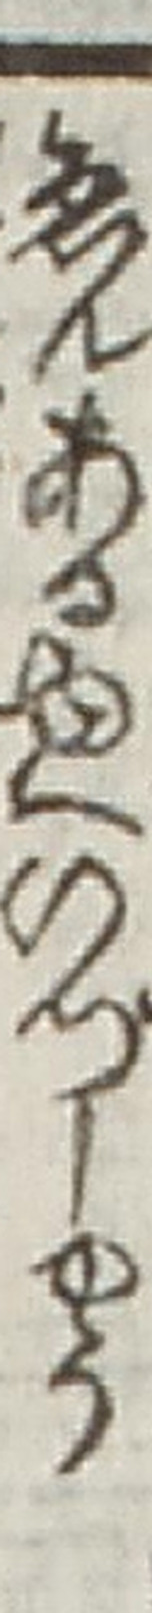ゑんあるゆへいつしやう
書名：三世相出雲當座帳　上下冊
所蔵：東京大学地震研究所図書室 Earthquake Research Institute Library, The University of Tokyo, JAPAN
